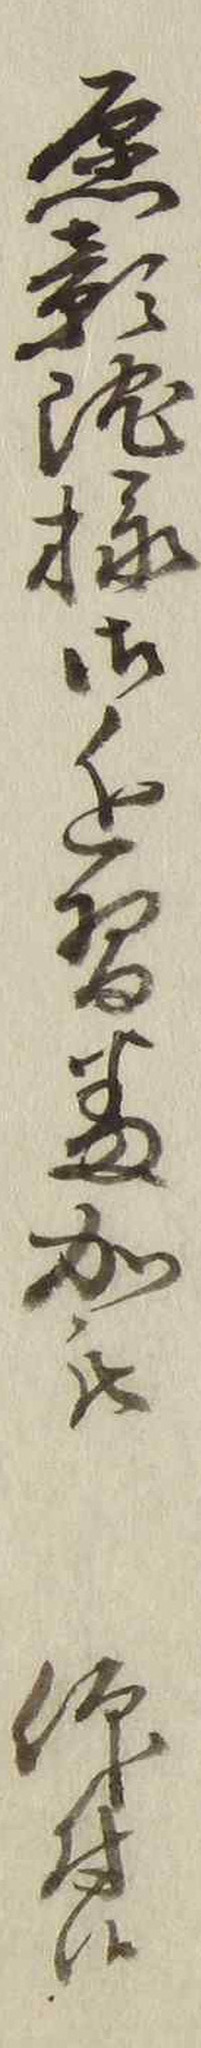愿彰院様御近習番加被仰付候

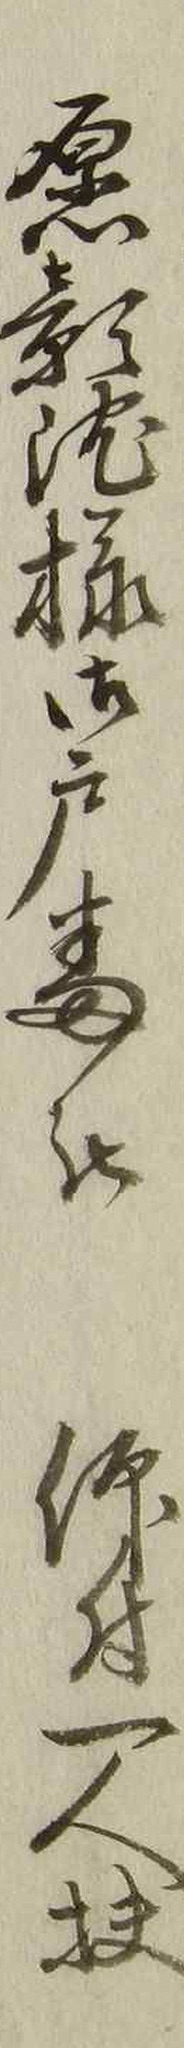愿彰院様御戸番被仰付一人扶
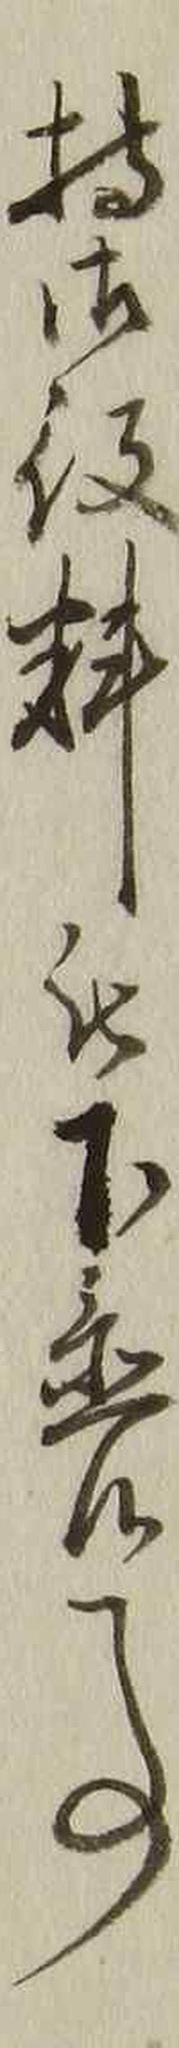持御役料被下置候事
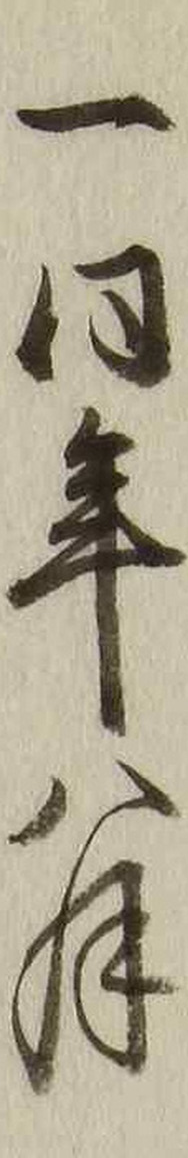一同年八月
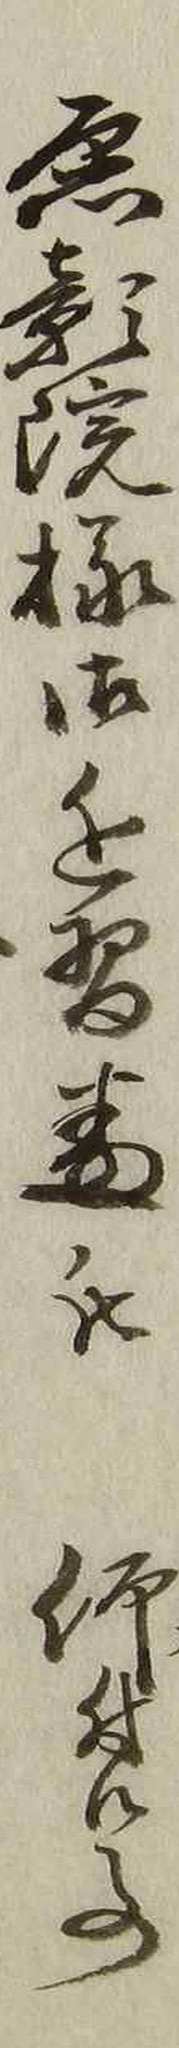愿彰院様御近習番被仰付候事
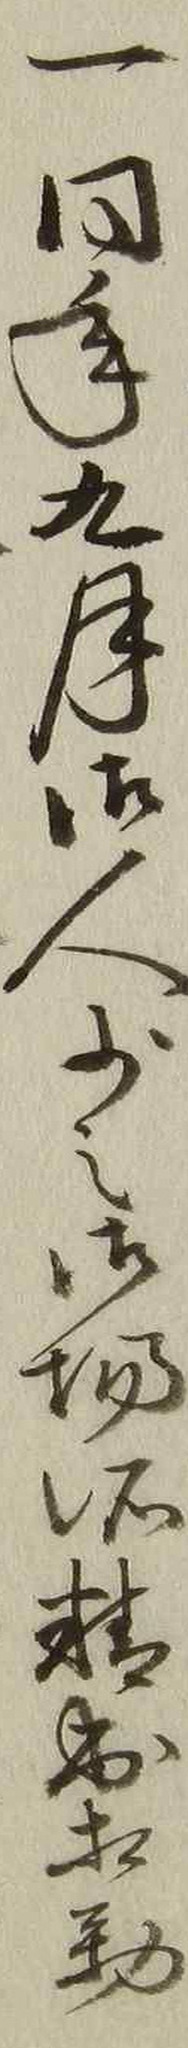一同年九月御人少之御場所精出相勤
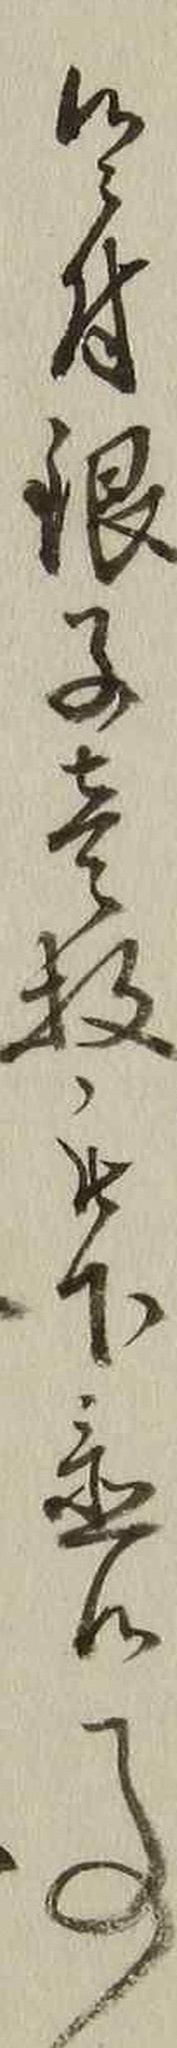候ニ付銀子壱枚被下置候事
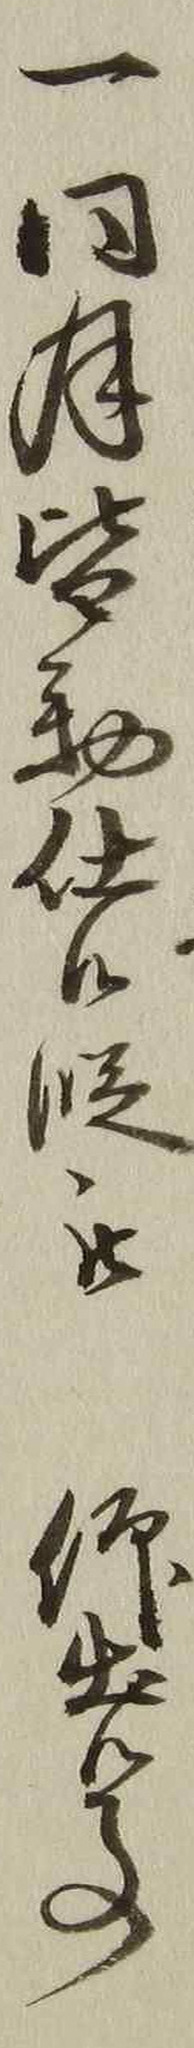一同月皆勤付候段被仰出候事
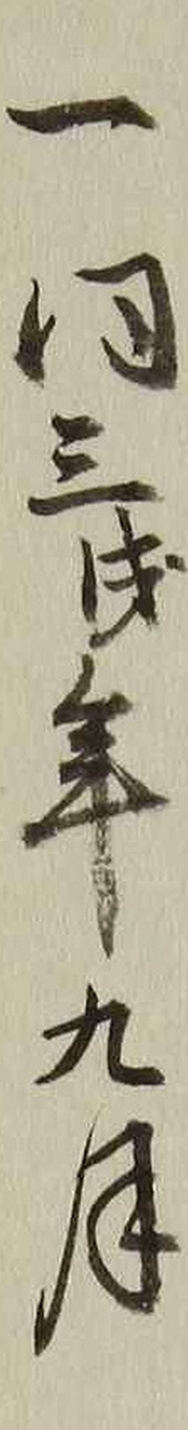一同三戌九月
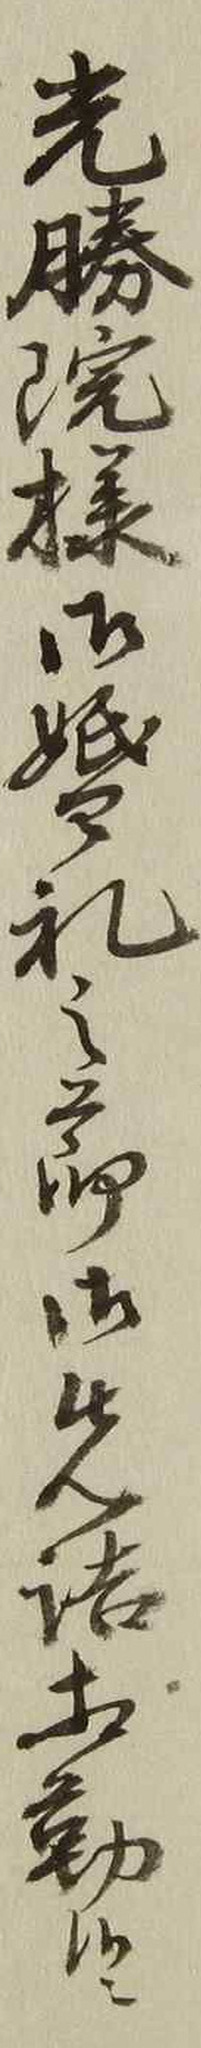光勝院様御婚礼之節御先詰相勤候ニ
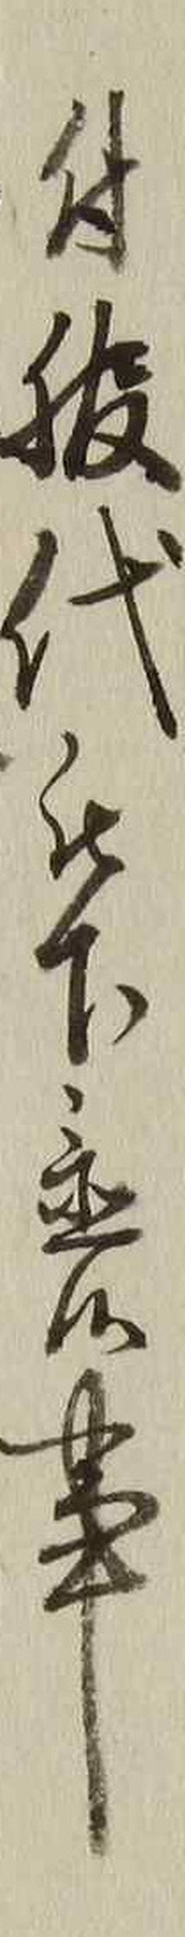付服代被下置候事
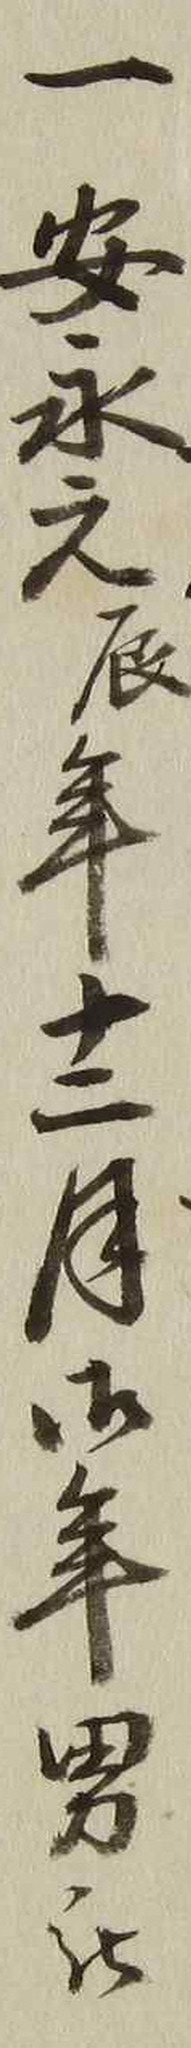一安永元辰年十二月御年男被
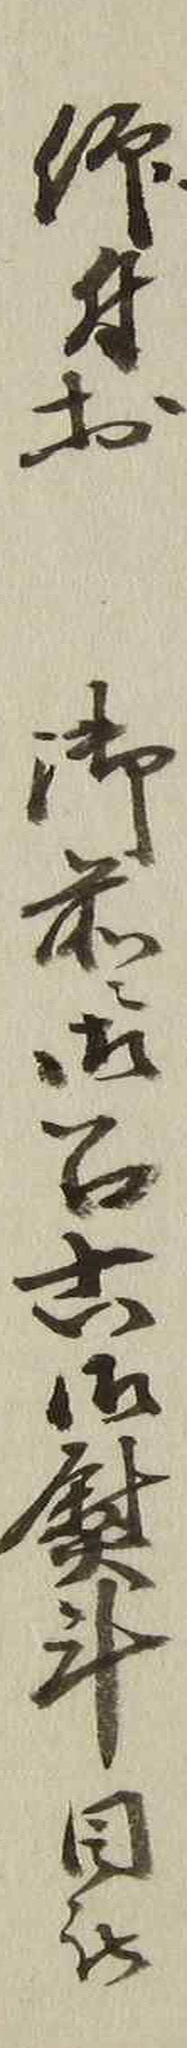仰付於御前ニ御召古御熨斗目被
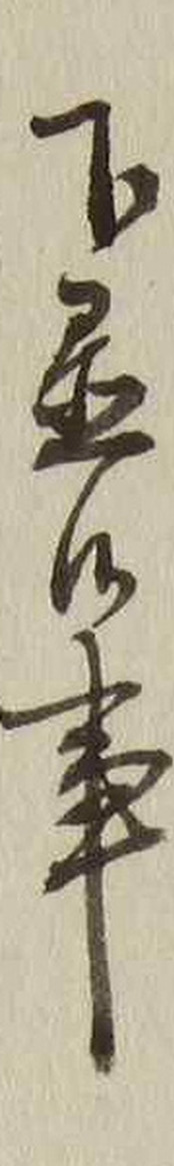下置候事
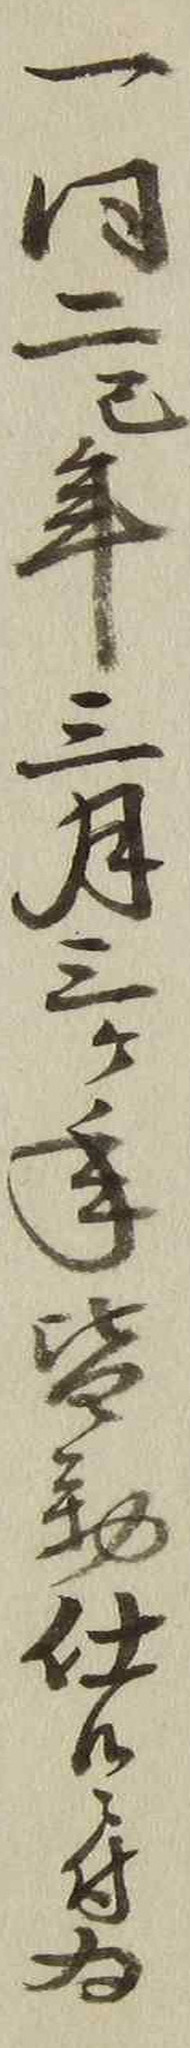一同二巳年三月三ケ年皆勤仕候ニ付為
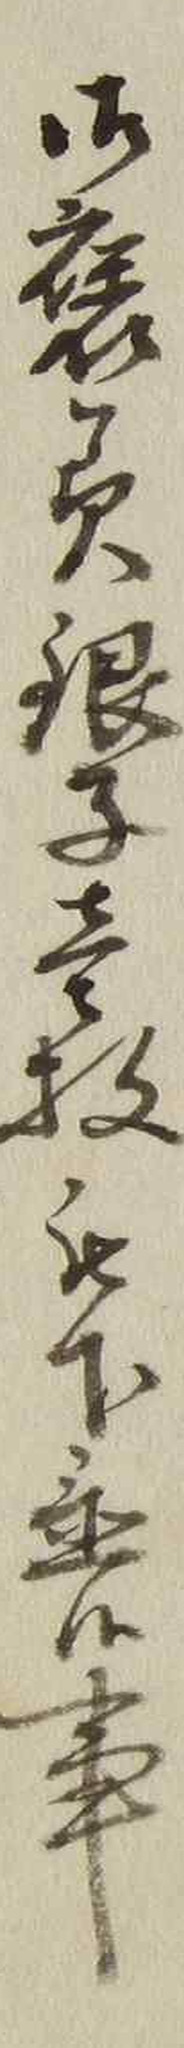御褒美銀子壱枚被下置候事
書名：諸士系譜　巻之31　い之部31
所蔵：会津若松市立会津図書館
